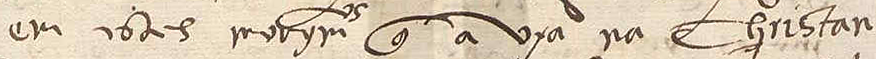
em estes mouymtos q̄ avya na Christan
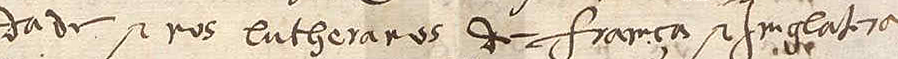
dade e nos lutheranos de framça e Jmglatera
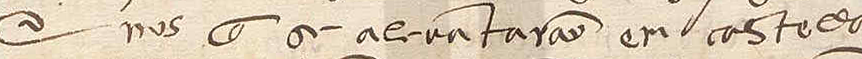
e nos q̄ se aleuātarão em castella
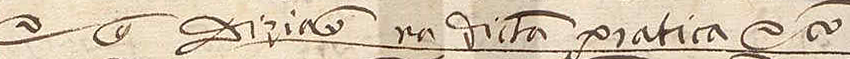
e q̄ Diziaõ na dict̄a pratica e cō
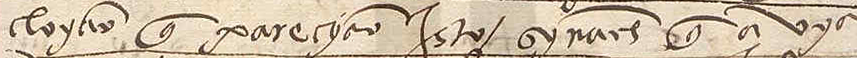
cloyão q̄ parecyão Jsto / syn̄aes q̄ avya
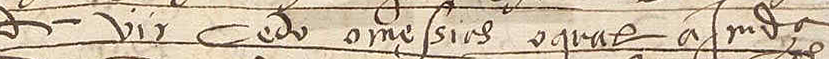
de vir Cedo o messias o quaL aJmda
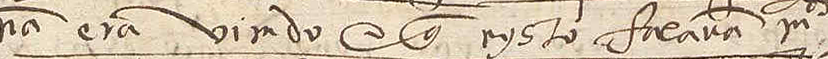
nā era vimdo e q̄ nysto falaūa mtas
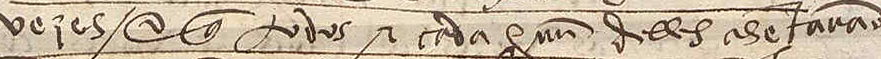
vezes / e q̄ todos e cada huū delles asētauão
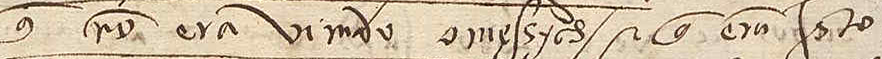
q̄ n̄o era vindo o messyas / e q̄ er̄a Jsto
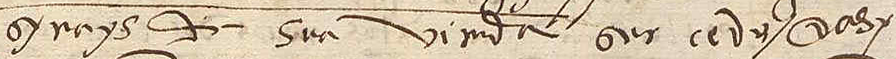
synays de sua vimda ser cedo / e asy
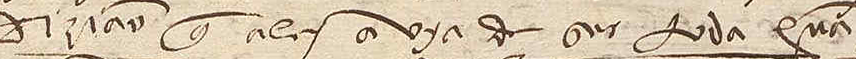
dizião q̄ a ley avya de ser toda hūa
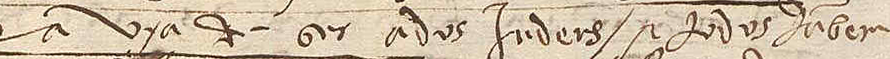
e avya de ser a dos Judeus / e todos tābem
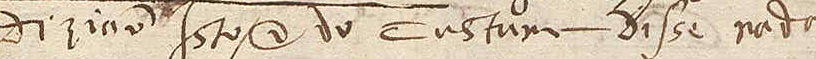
dizião Jsto / e do custume disse nada
